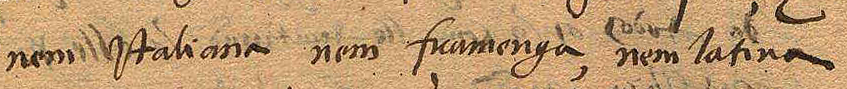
nem Jtaliana nem framenga, nem latina
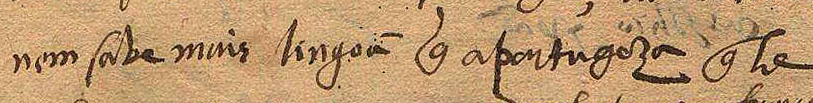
nem sabe mais lingoa q̄ a portugeza q̄ he
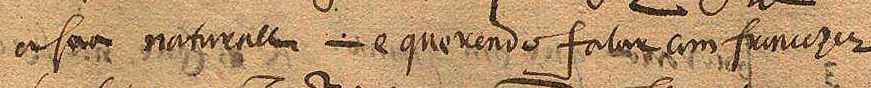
a sua naturall — e querendo falar com francezes
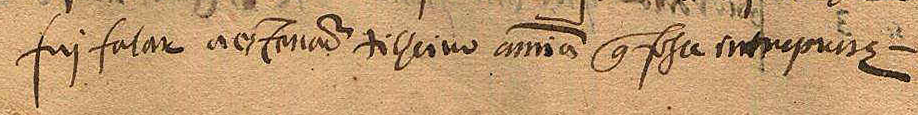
fuj falar a esteuão telheiro am̄ia q̄ fosse intreprete
